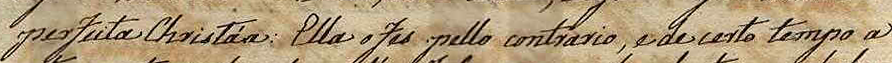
perfeita Christáa: Ella o fes pello contrario, e de certo tempo a
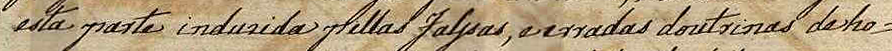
esta parte induzida pellas falssas, e erradas doutrinas de ho
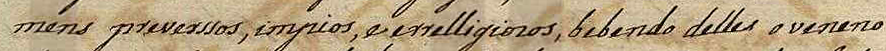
mens preverssos, impios, e errelligiozos, bebendo delles o veneno
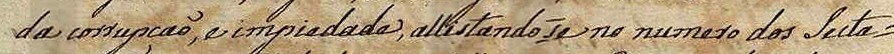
da corrupçaõ, e impiedade, allistando-se no numero dos Secta
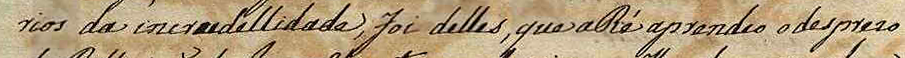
rios da incrudellidade, foi delles, que a Ré aprendeo o desprezo
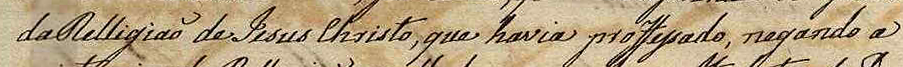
da Relligiaõ de Iesus Christo, que havia proffessado, negando a
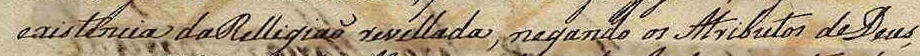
existencia da Relligiaõ revellada, negando os Atributos de Deus,
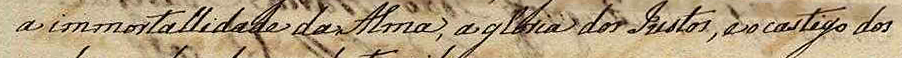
a immortallidade da Alma, a gloria dos Iustos, e o castigo dos
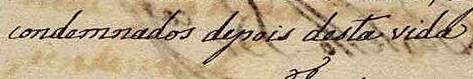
condemnados depois desta vida.
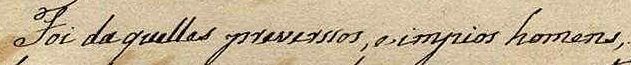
Foi daquelles preverssos, e impios homens,
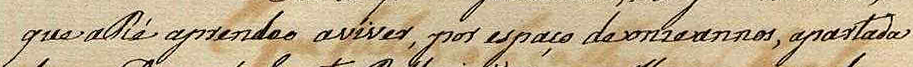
que a Ré aprendeo a viver, por espaço de onze annos, apartada
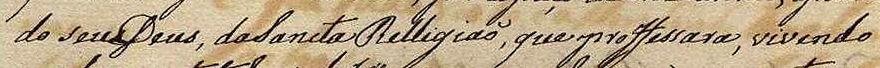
do seu Deus, da Sancta Relligiaõ, que proffessara, vivendo
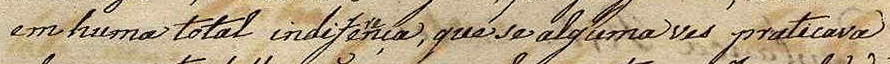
em huma total indiferença, que se alguma ves praticava
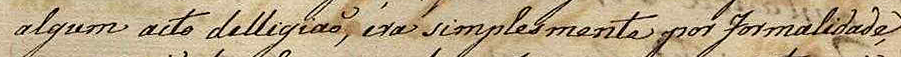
algum acto delligiaõ, era simplesmente por formalidade,
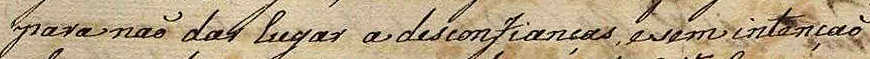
para naõ dar lugar a desconfianças, e sem intençaõ
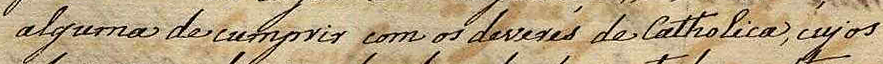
alguma de cumprir com os deveres de Catholica, cujos
